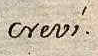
crevi.
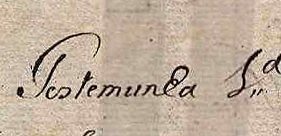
Testemunha 1.a
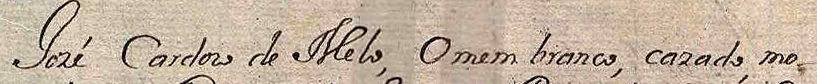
Iozé Cardozo de Melo, Omem branco, cazado, mo
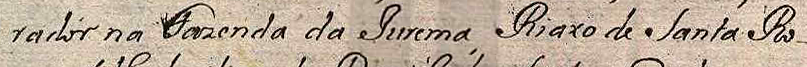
rador na Fazenda da Iurema, Riaxo de Santa Ro
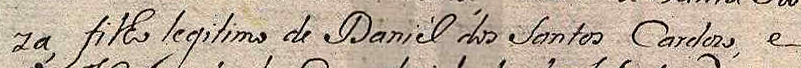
za, filho legitimo de Daniel dos Santos Cardozo, e
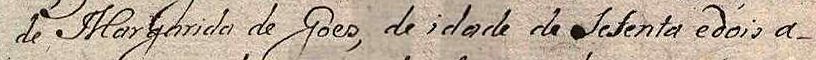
de Margarida de Goes, de idade de sesenta e dois a
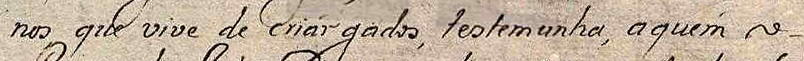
nos que vive de criar gados, testemunha, a quem o
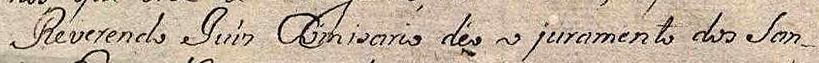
Reverendo Iuis Comisario deo o juramento dos San
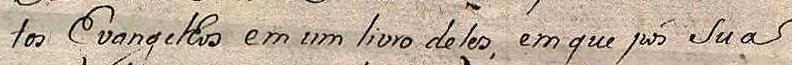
tos Evangelhos em um livro deles, em que pós sua
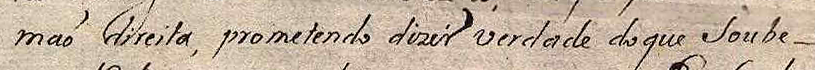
maõ direita, prometendo dizer verdade do que Soube
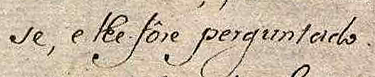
se, e lhe fôse perguntado.
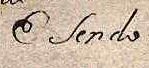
E sendo
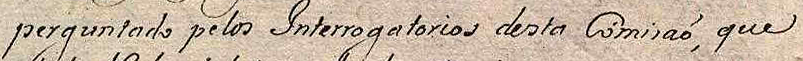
perguntado pelos Interrogatorios desta Comisaõ, que
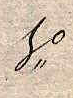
1o
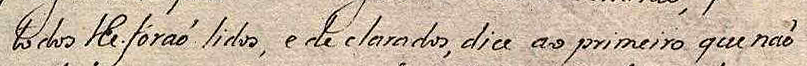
todos lhe foraõ lidos, e declarados, dice ao primeiro que naõ
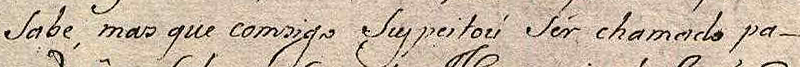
sabe, mas que comsigo suspeitou ser chamado pa
